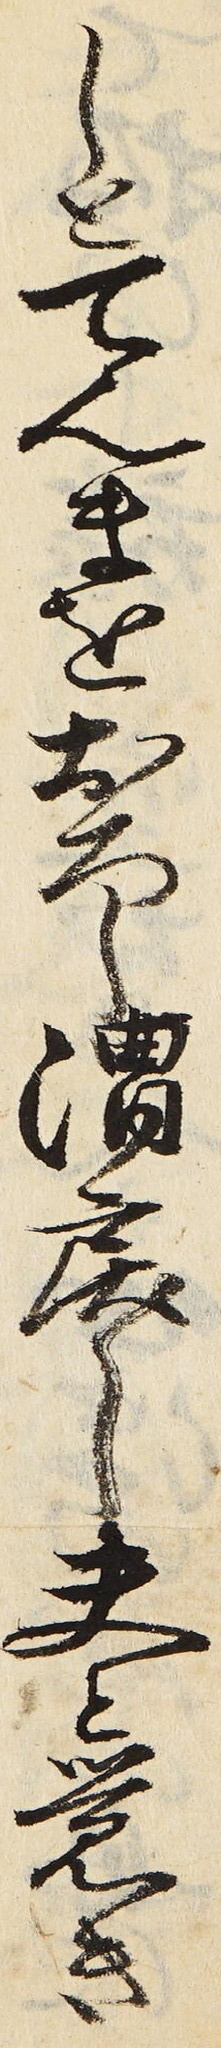しとてんまをおろし漕戻し夫と覚き
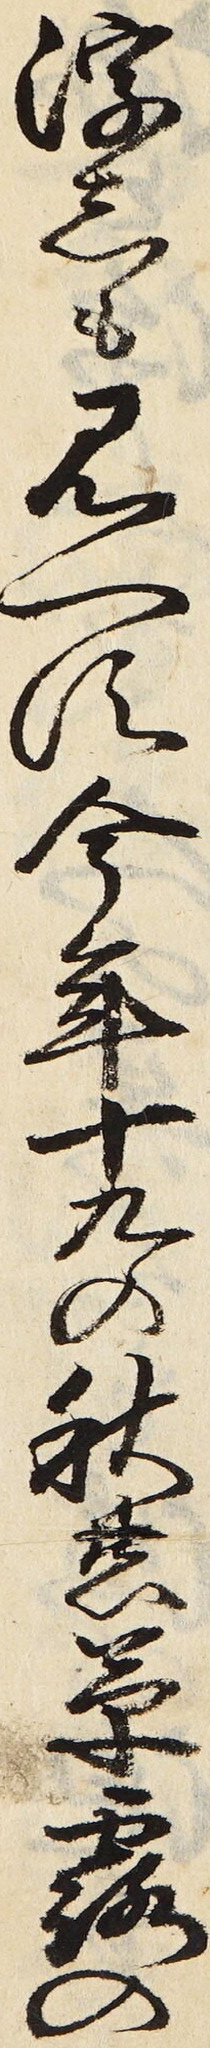浮者も見へす今年十九の秋の草露の
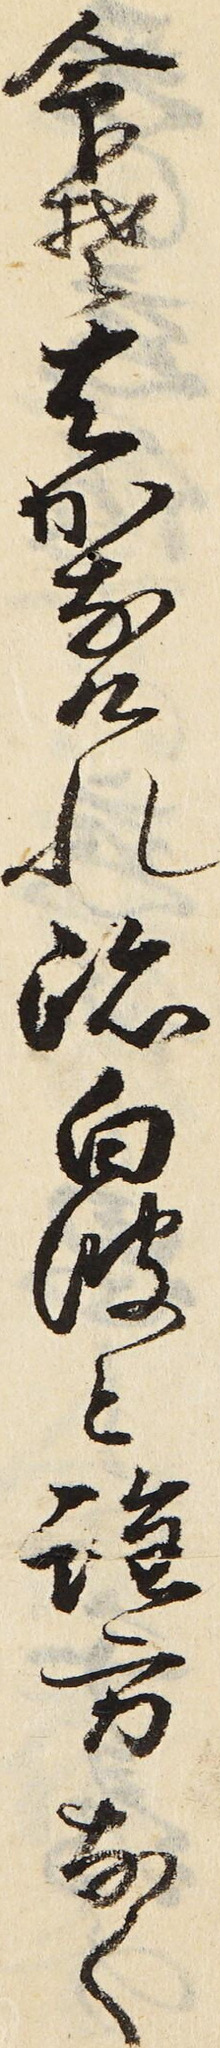命そはかなけれ跡白波と詮方なく
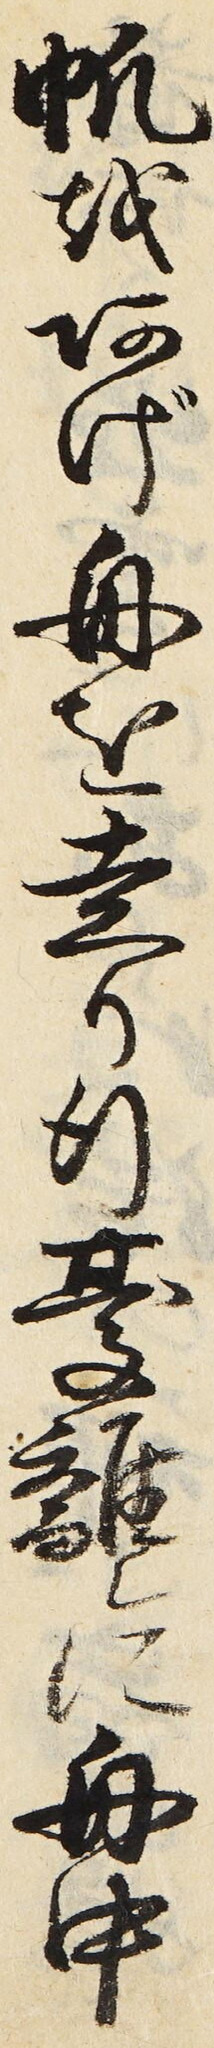帆をあげ舟を走り行離れに舟中
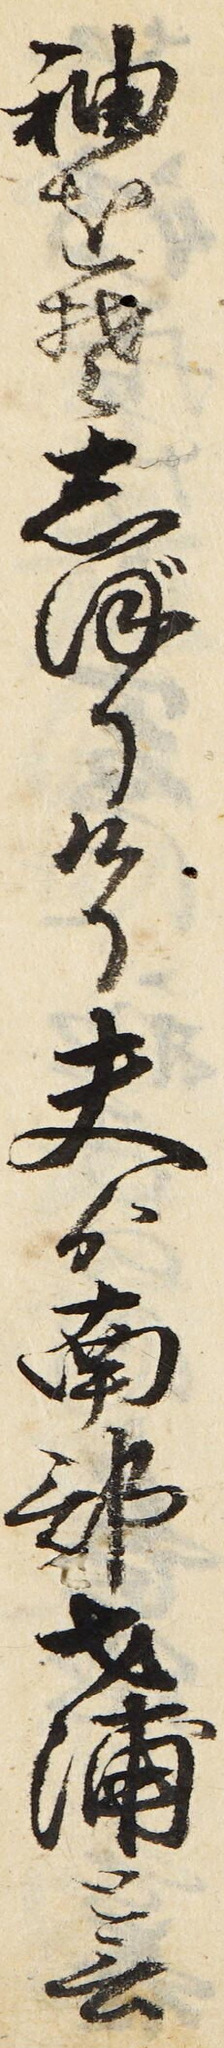袖をそしぼりけり夫ゟ南部才浦と云
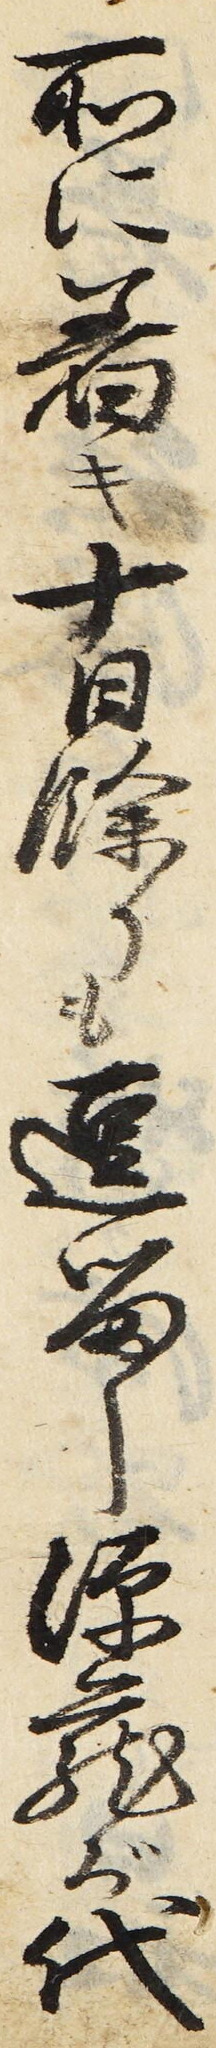所に着き十日余りも逗留し源蔵が代
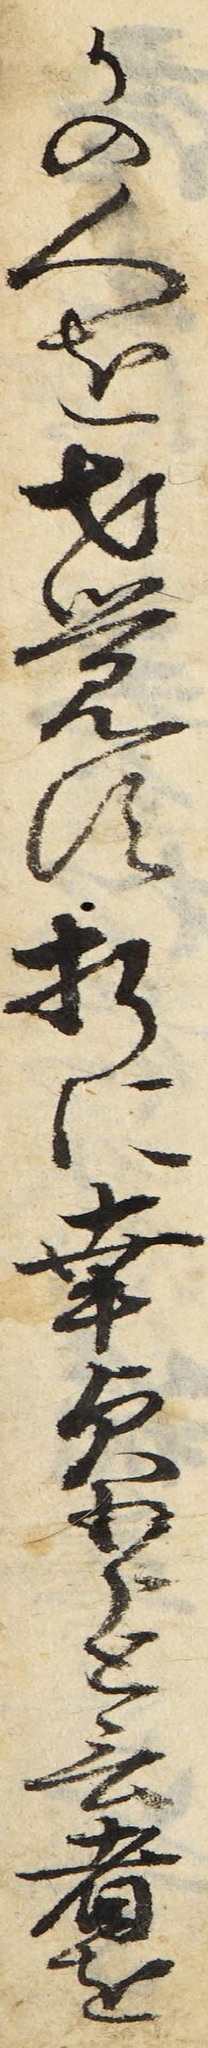りの人を才覚す折に幸貞五郎と云者を

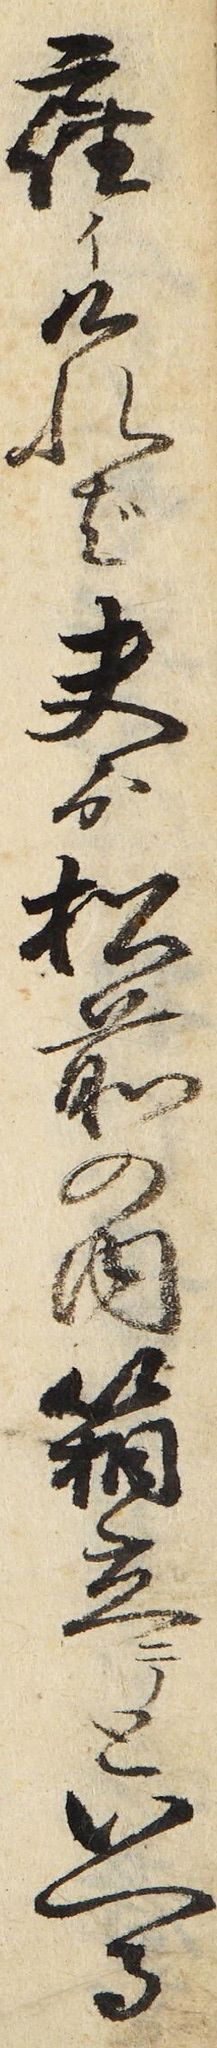雇いければ夫ゟ松前の内箱立てといへる
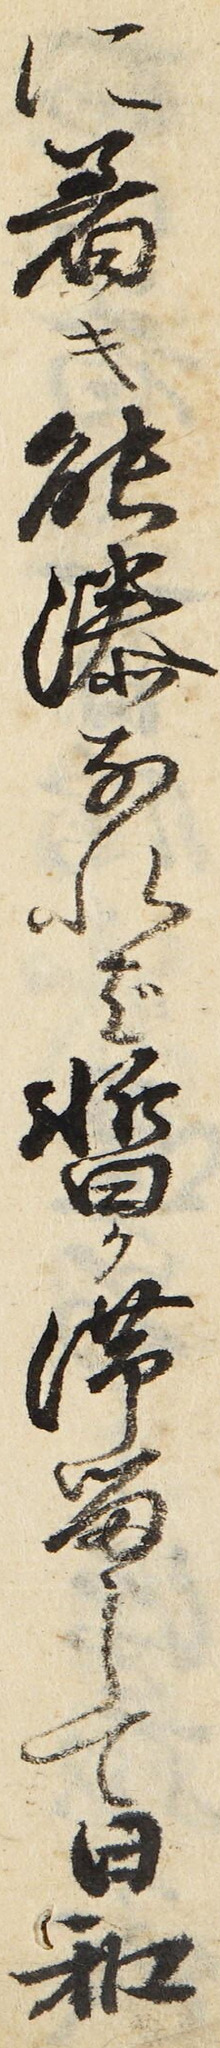に着き能湊なれば暫く滞留して日和
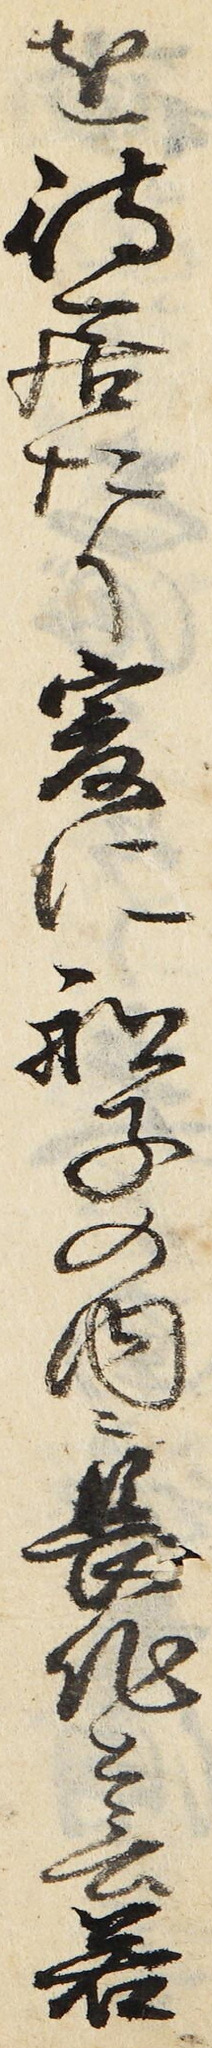を待居たり爰に船子の内に長作と云若
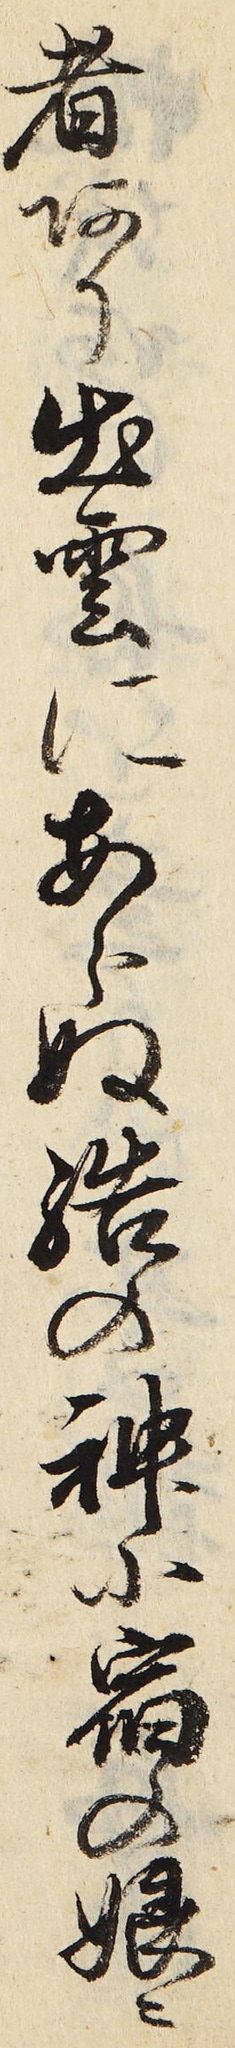者あり出雲にあらぬ結の神に宿の娘に
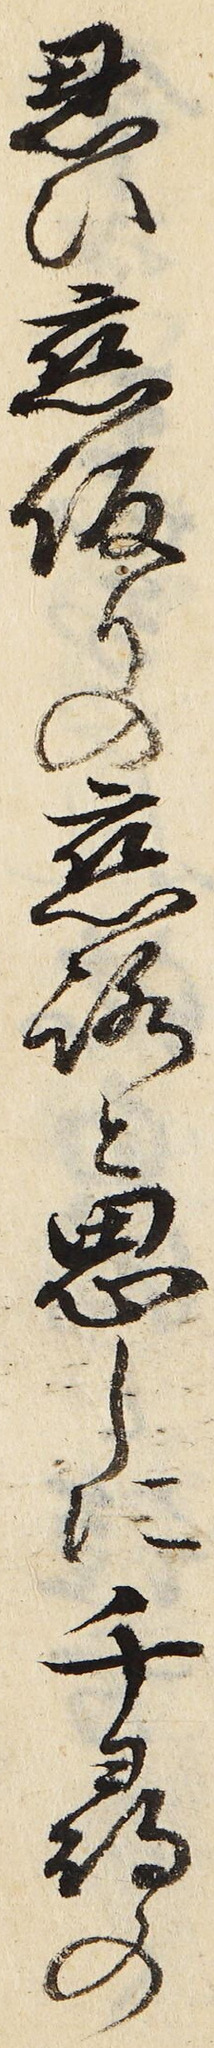思ひ恋仮りの恋路と思しに千尋の
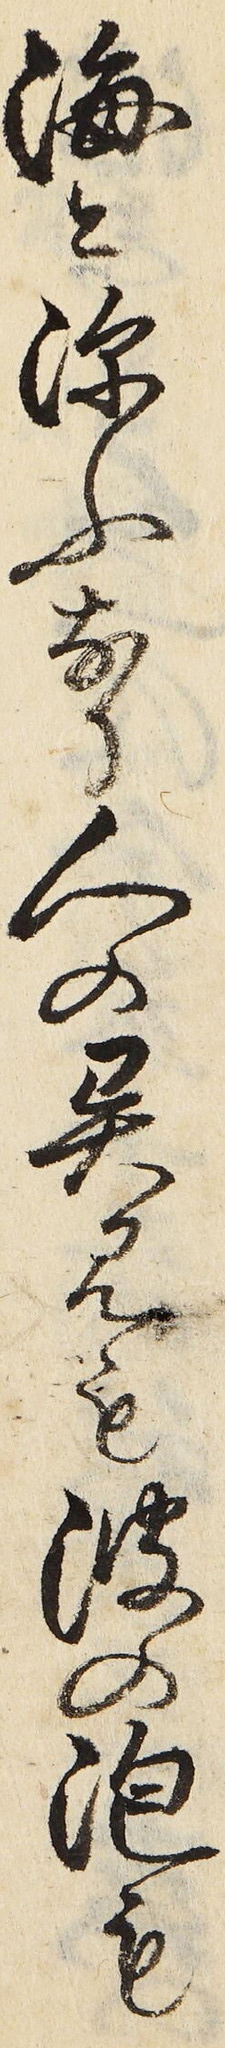海と深ふなり人の異見も波の泡も
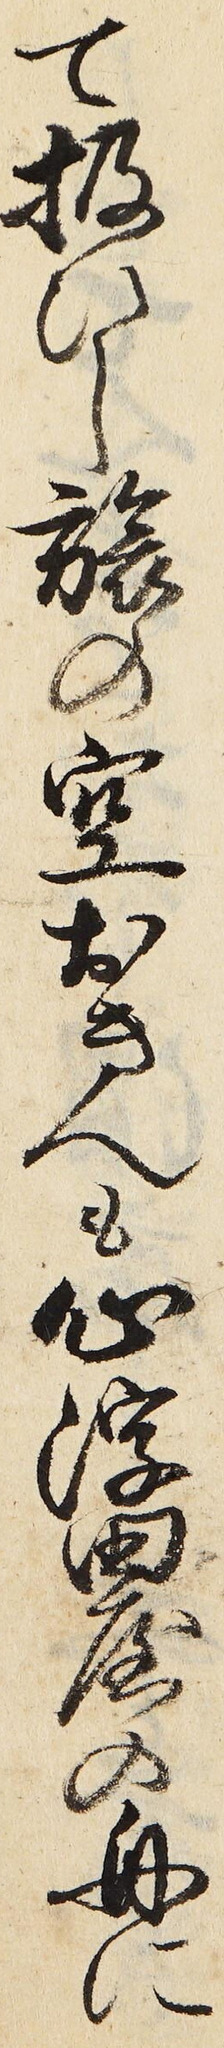て扱ひし旅の空おきんも心浮田屋の舟に
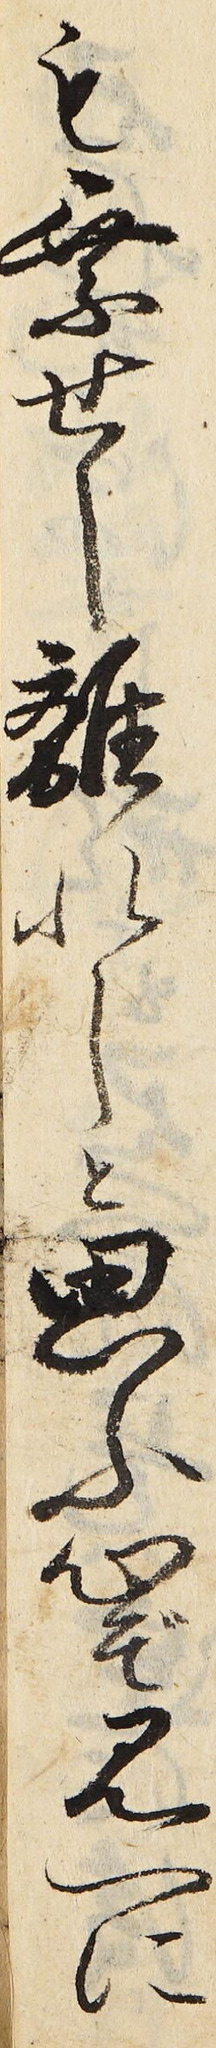も乗せし離れしと思ふ心ぞ見へに
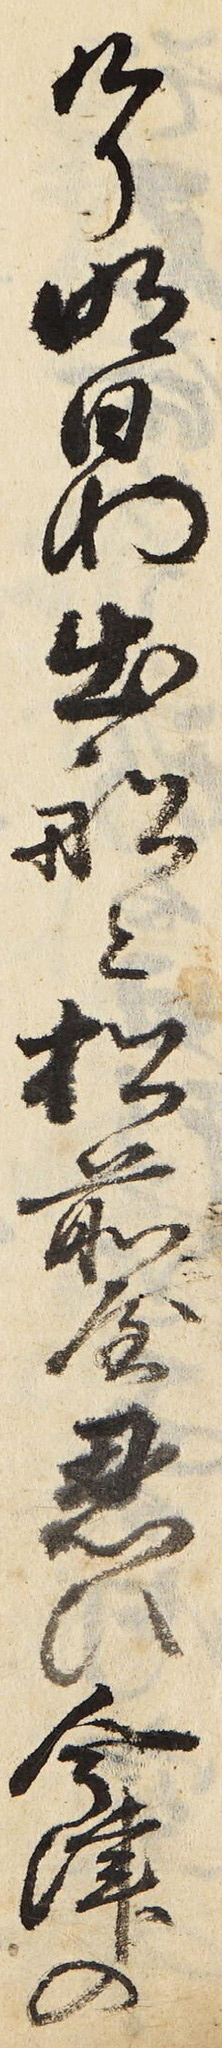けり明日わ出船と松前屋思ひ今津の
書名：華夷九年録
